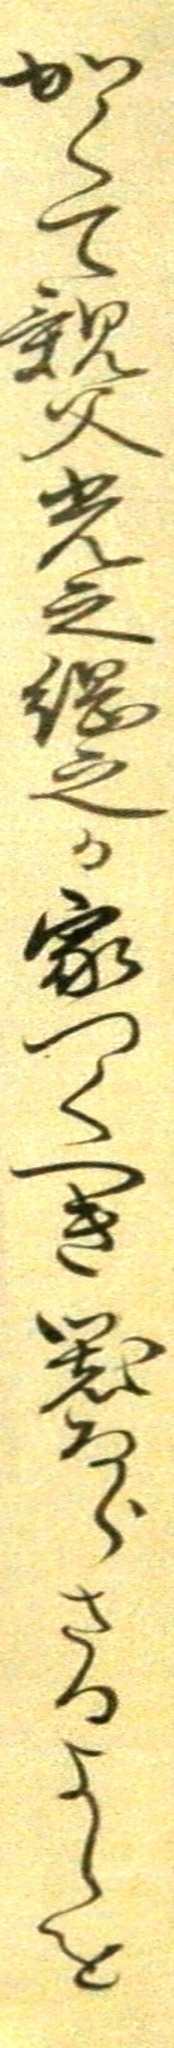かくて親父光之綱之か家つくへき器ならさるよしを
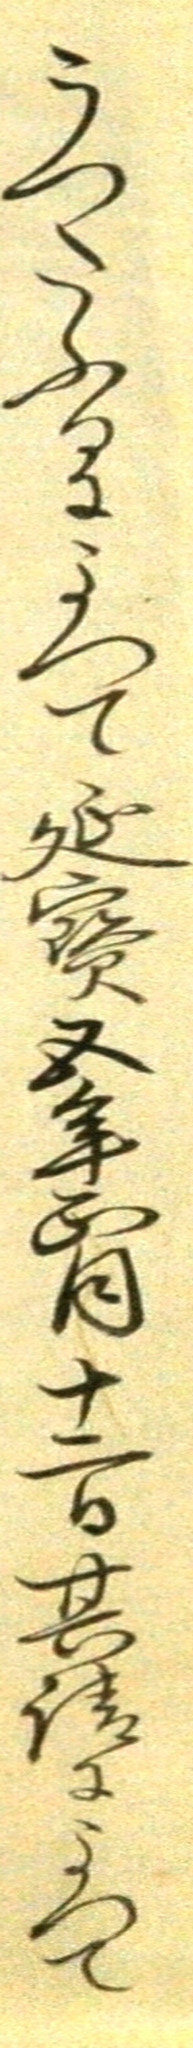うつたふるによつて延宝五年正月十二日其請によつて
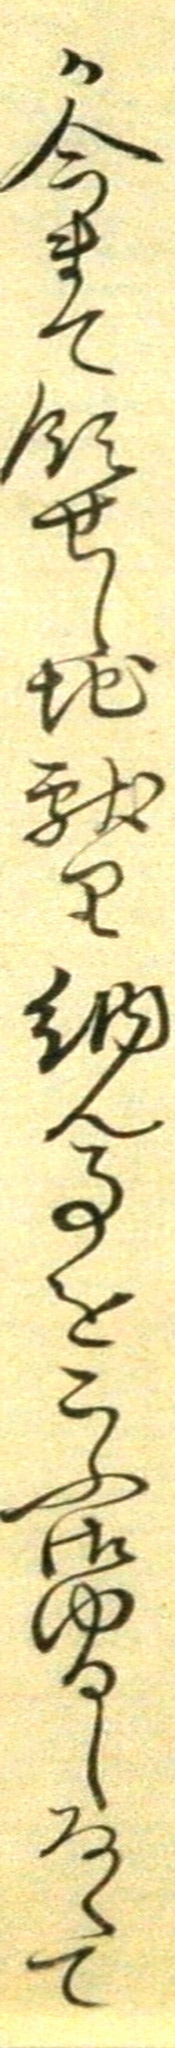か今まて領せし地献り納ん事をこふ御ゆるしなくて
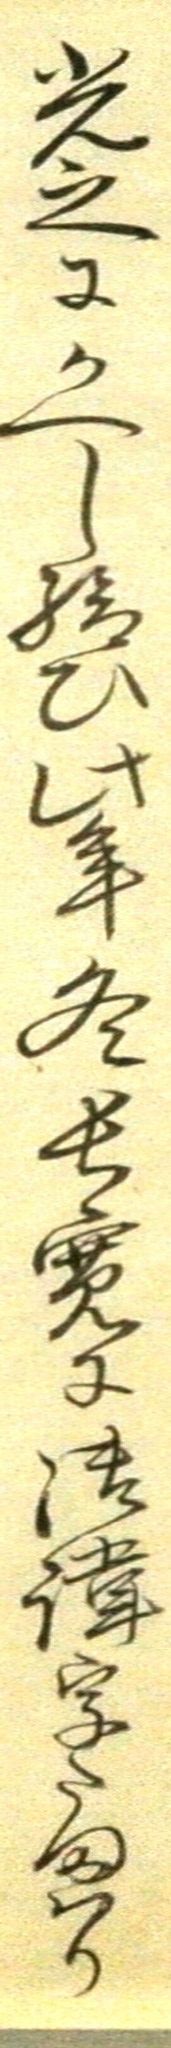光之にかへし給ひ此年冬長寛に御諱字たまはり
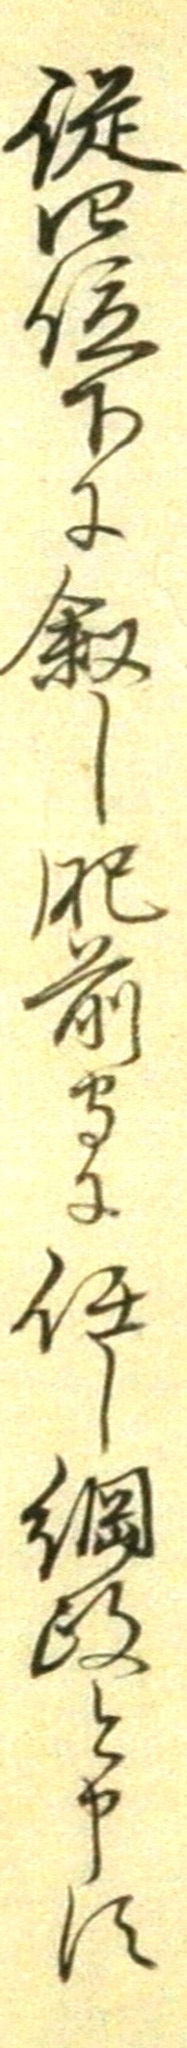従四位下に叙し肥前守に任し綱政と申す
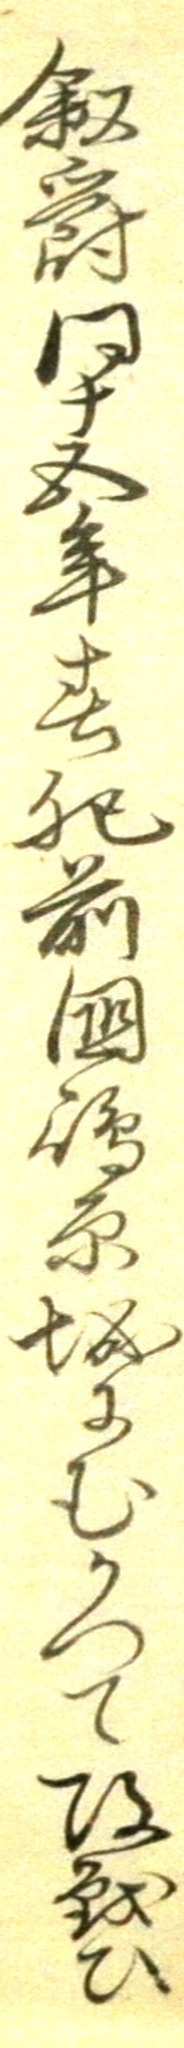叙爵同十五年春肥前国島原城にむかつて攻戦ひ
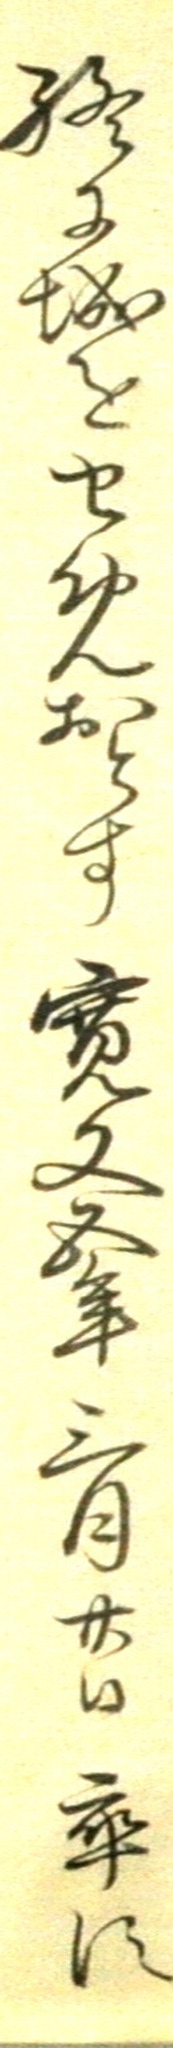終に城をせめおとす寛文五年三月廿日卒す
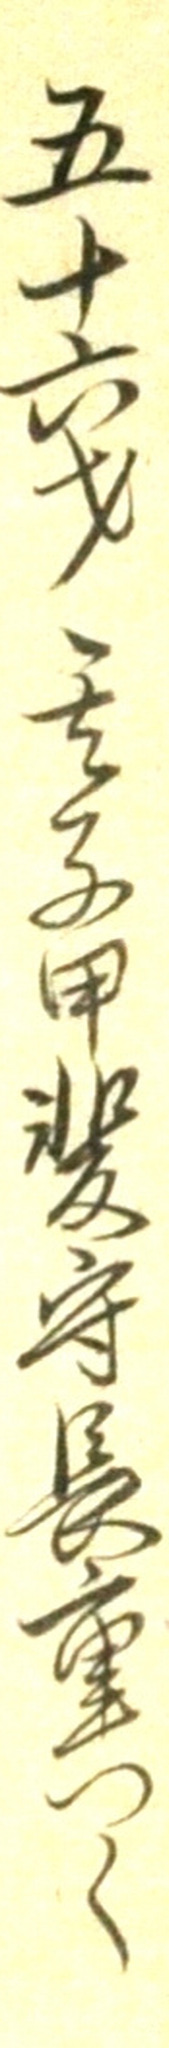五十六才其子甲斐守長重つく
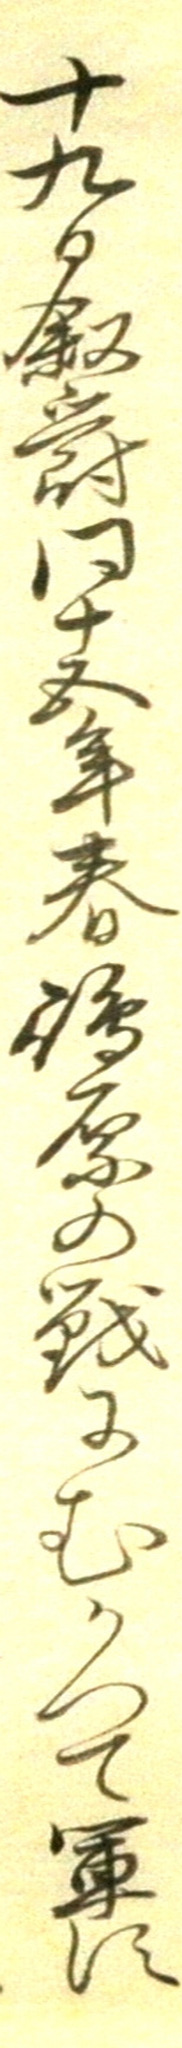十九日叙爵同十五年春島原の戦にむかつて軍す
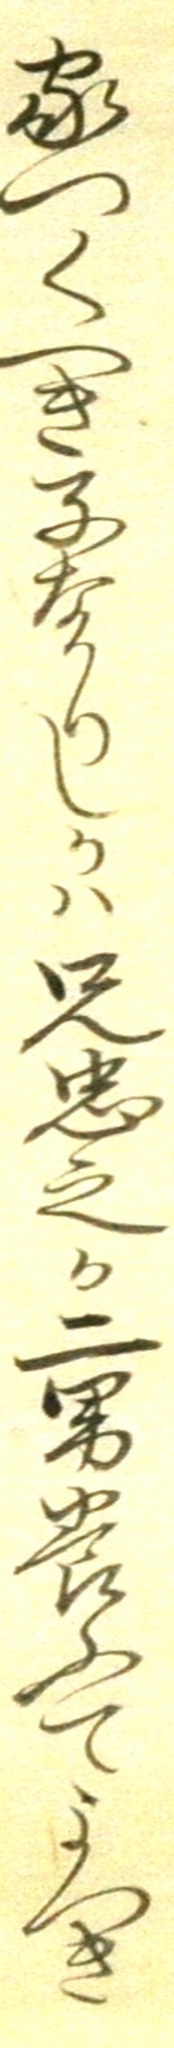家つくへき子なかりしかは兄忠之か二男養ふてよつき
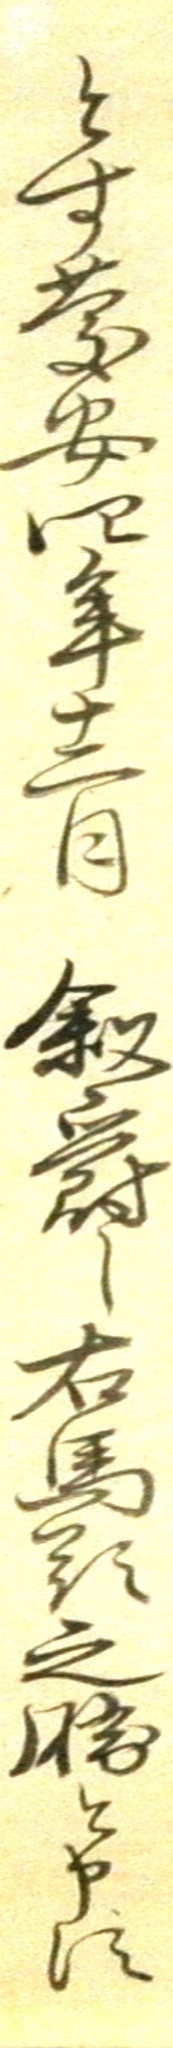とす慶安四年十二月叙爵し右馬頭之勝と申す
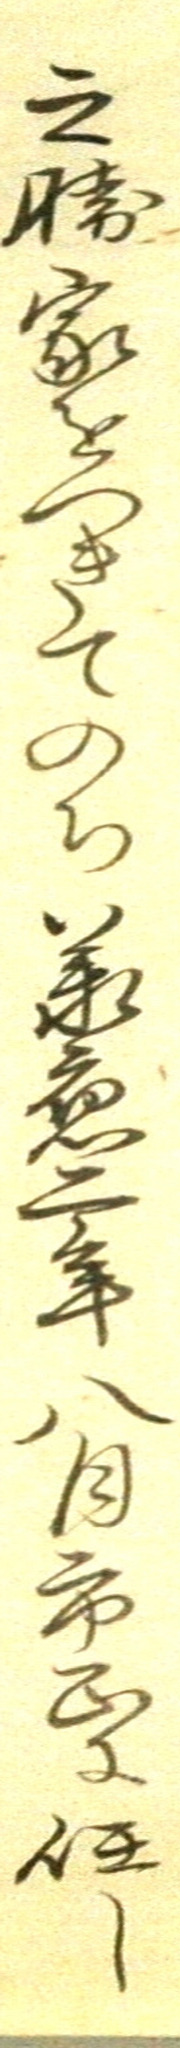之勝家をつきてのち承応二年八月市正に任し
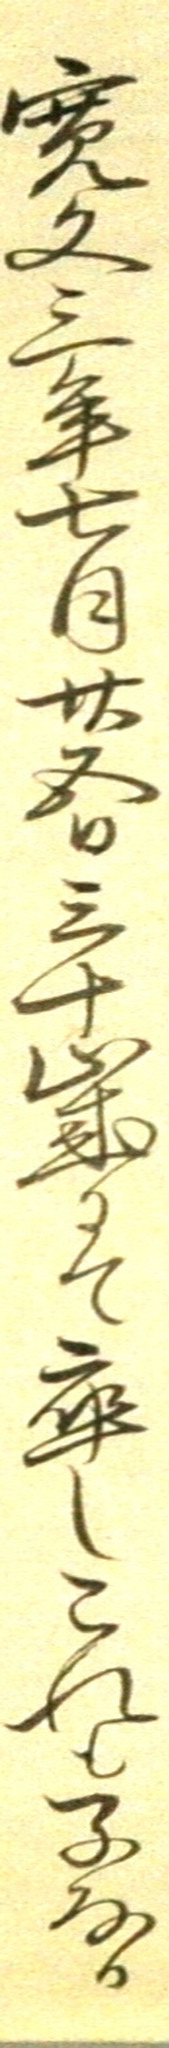寛文三年七月廿五日三十歳にて卒しこれも子なか
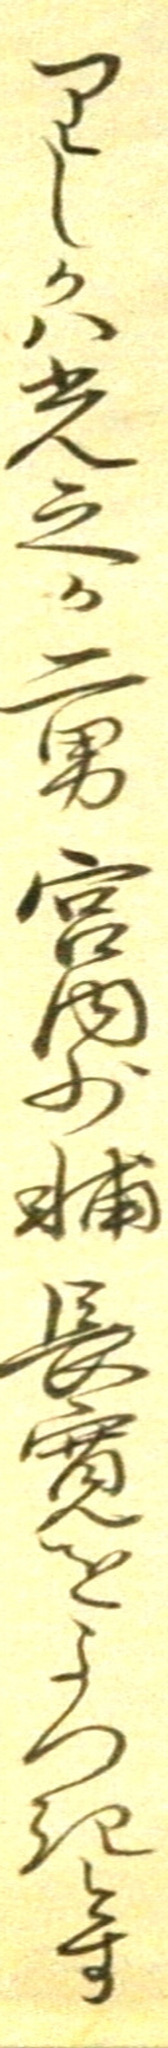りしかは光之か二男宮内少輔長寛をよつきとす
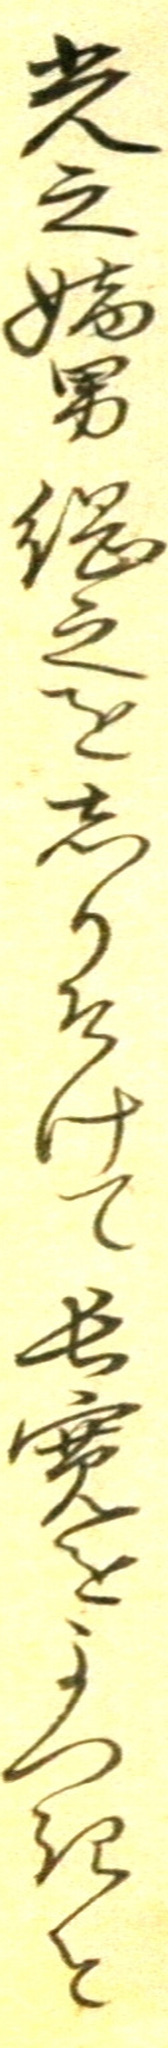光之嫡男綱之をしりそけて長寛をよつきと

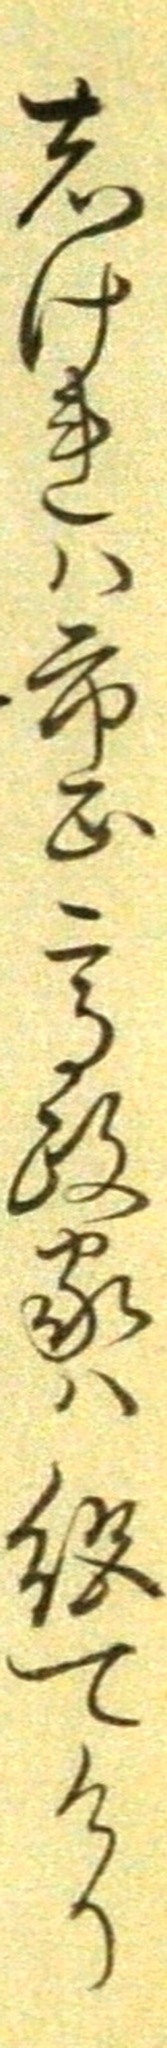しけれは市正高政家は絶てけり
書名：藩翰譜（七・上）
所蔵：伊那市立高遠町図書館・合同会社AMANE
